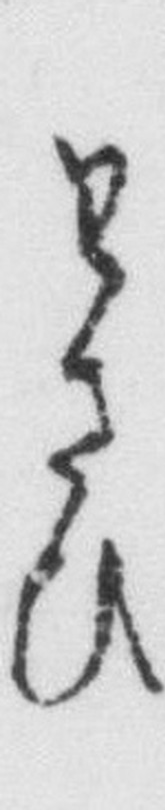わさひ
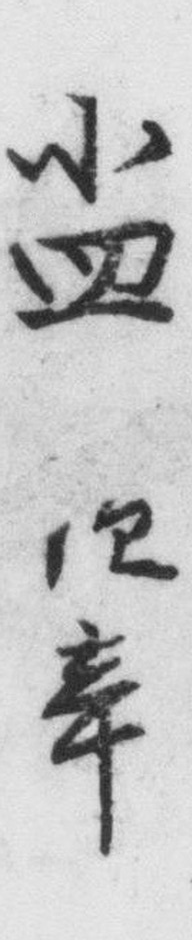小皿塩辛
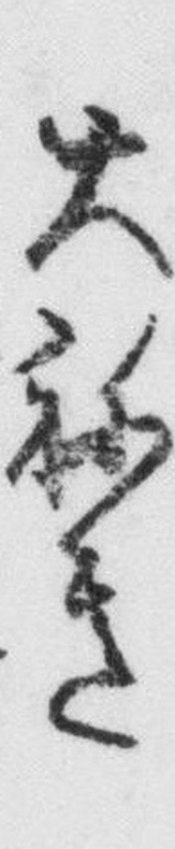大祢き
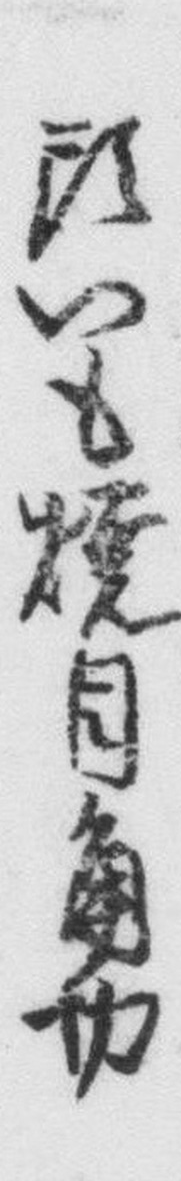頭いも焼目角切
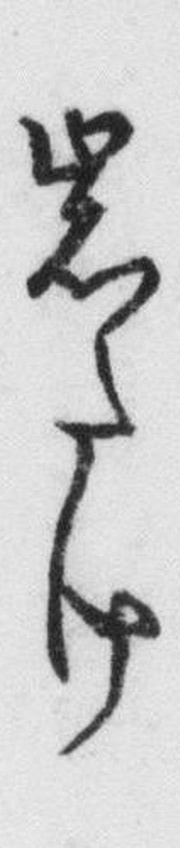岩たけ

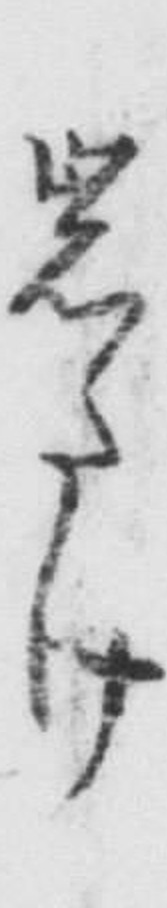初たけ
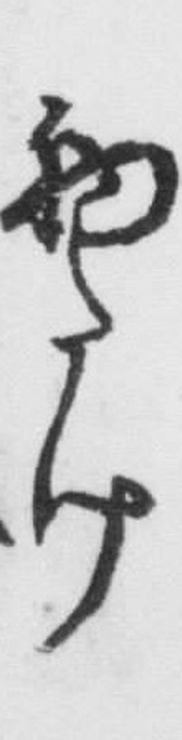初たけ
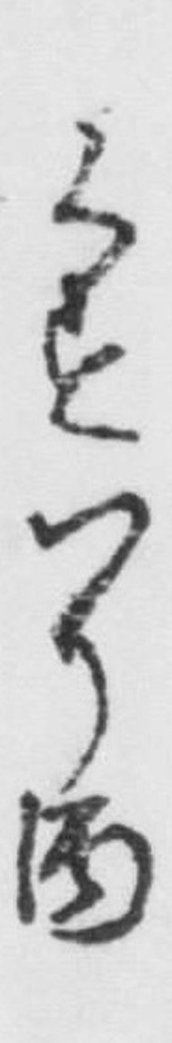く春いり酒
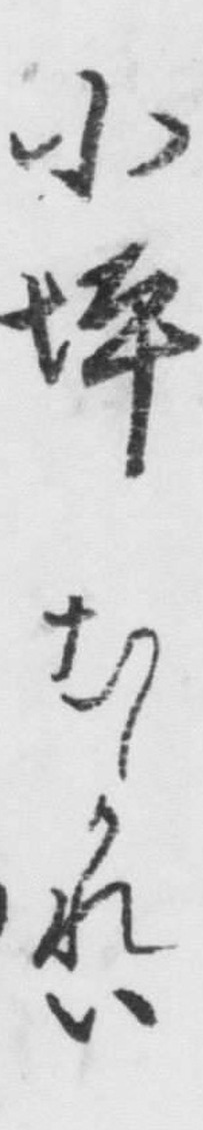小坪むしかれい
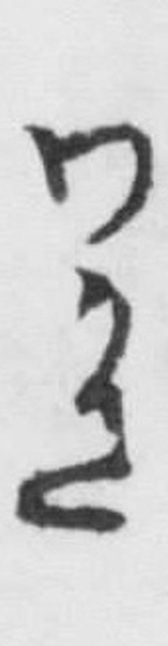わかさ

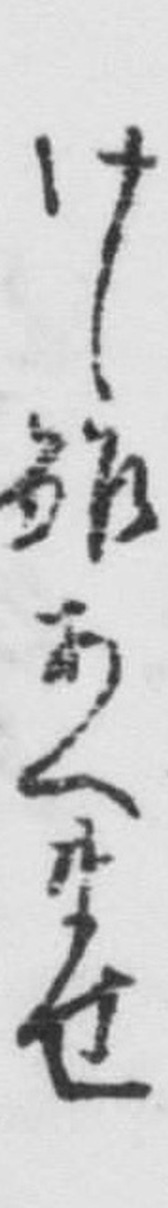けし酢あへませ
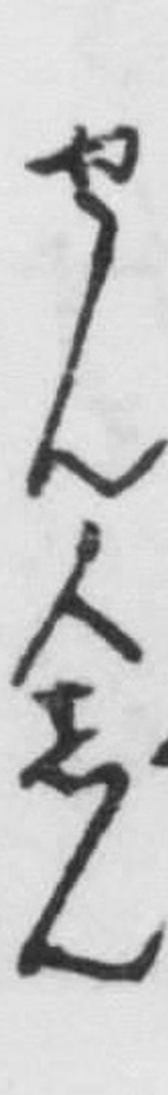せん人志ん
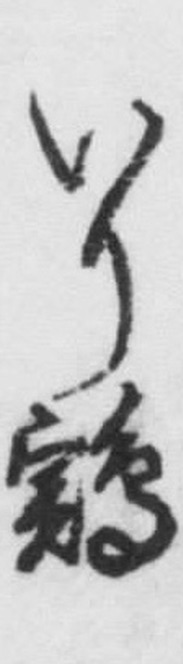いり鶏
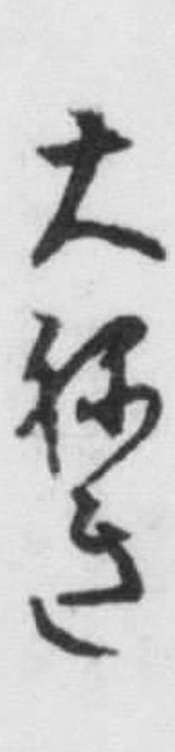大祢き
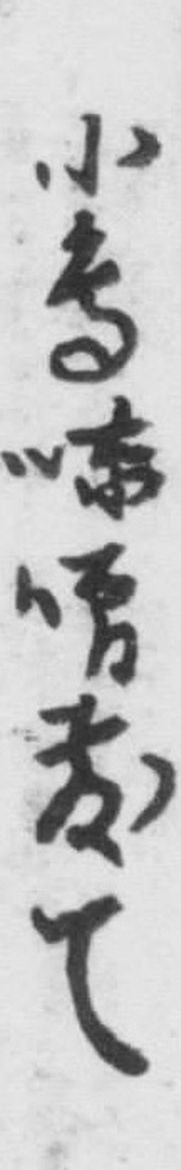小鳥味噌煮て
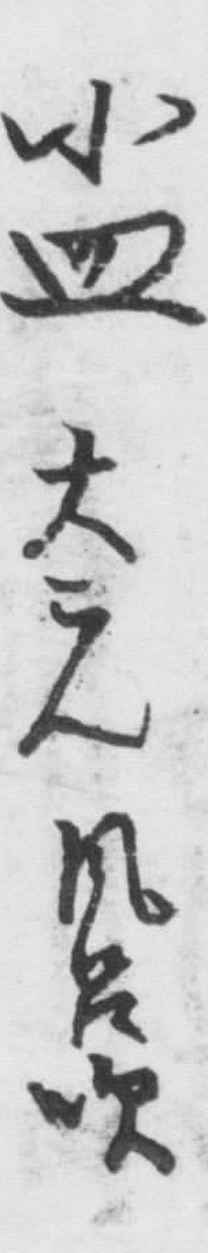小皿大こん風呂吹
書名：普茶料理抄
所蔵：大阪府立大学学術情報センター 国文学研究資料館
